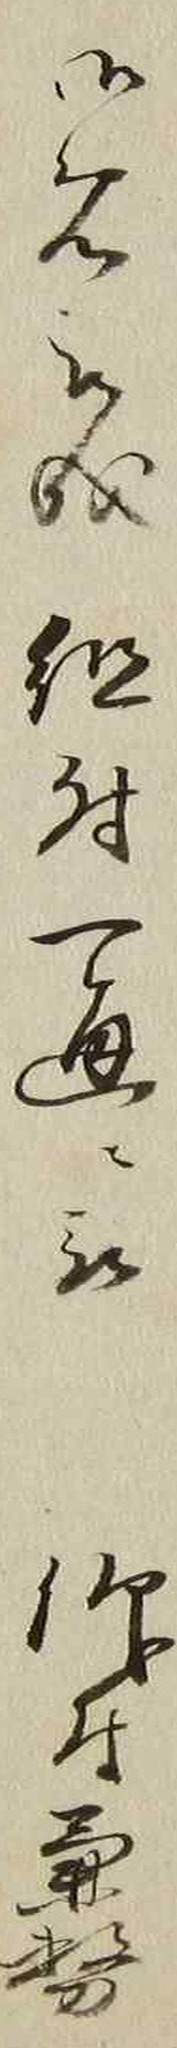御免被成組付一通ニ被仰付兼務
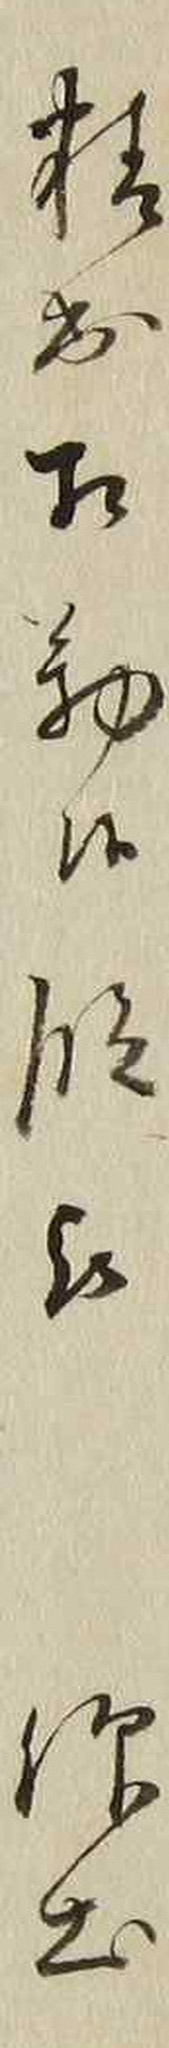精出相勤候段被仰出
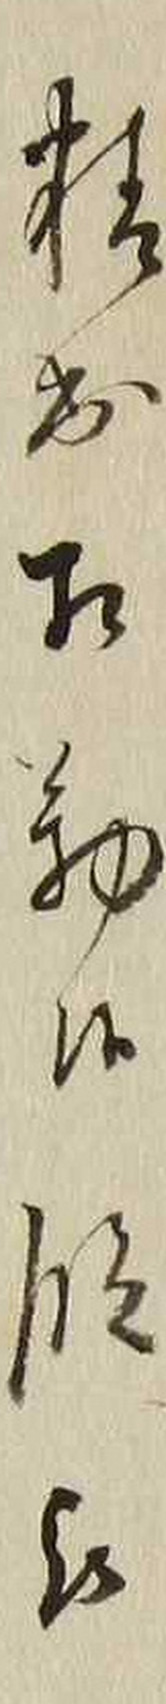精出相勤候段被仰出
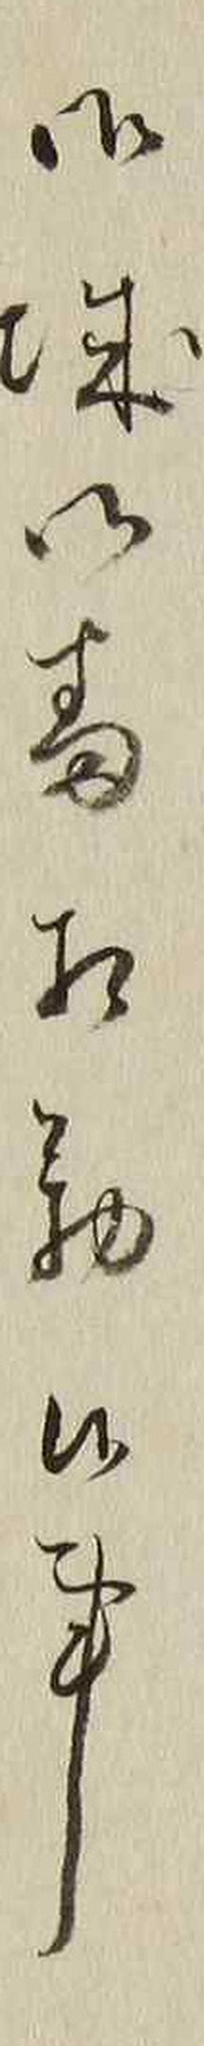御城御番相勤候事
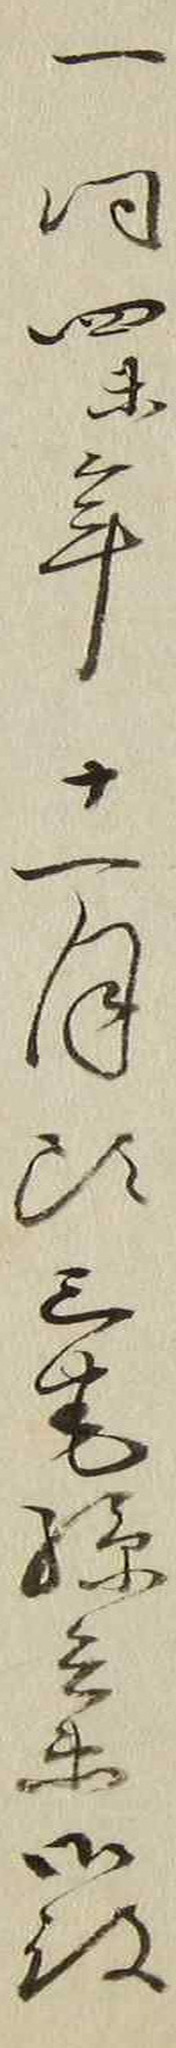一同四未年十一月頭三宅孫兵衛御役
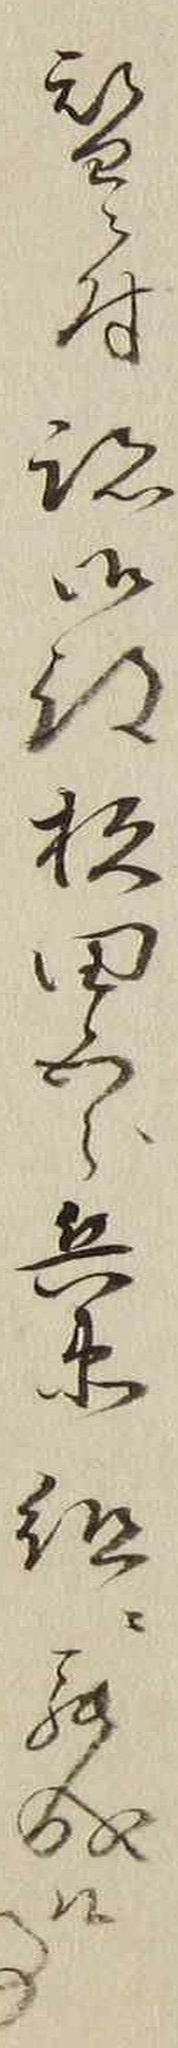替ニ付跡御役杉田五郎兵衛組ニ罷成候事
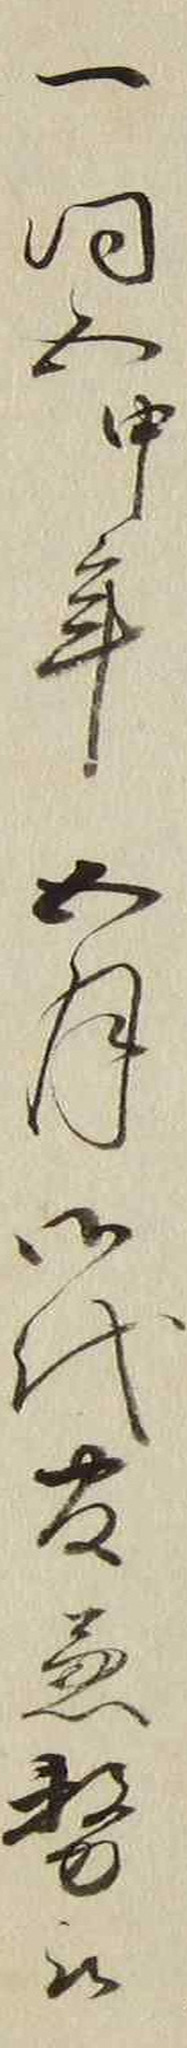一同五申年五月御代官兼務被
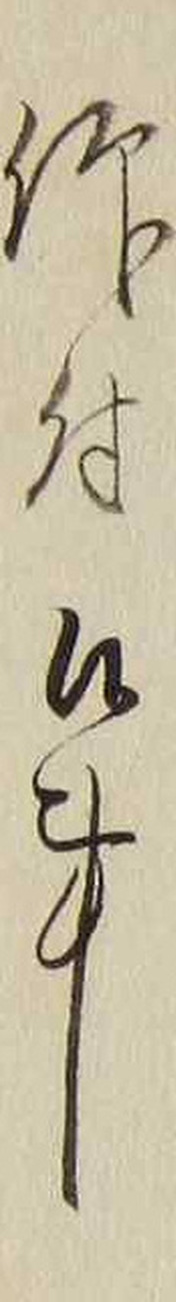仰付候事

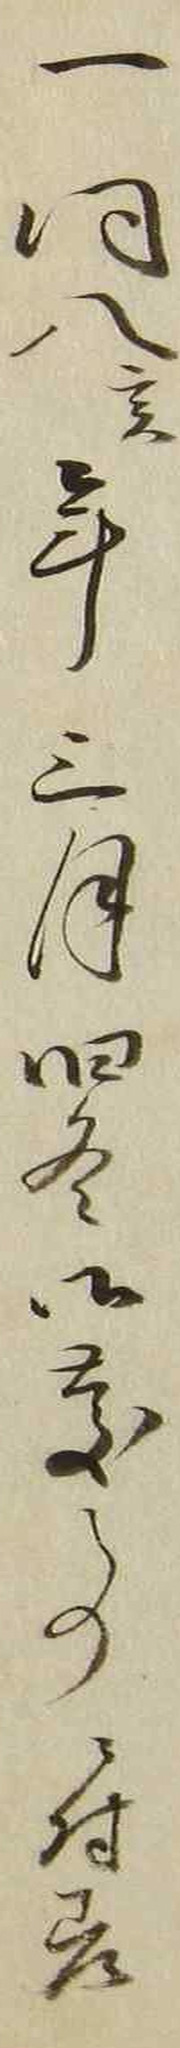一同八亥年三月旧冬御慶事ニ付差
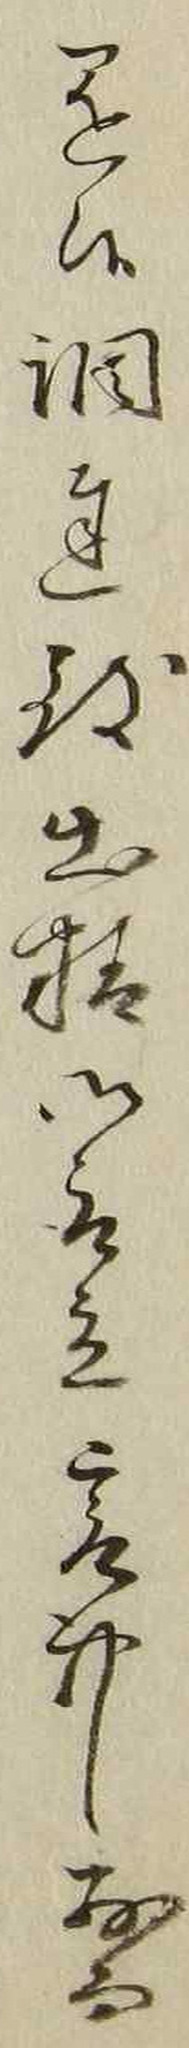遣候調達致出精御取立最中別而
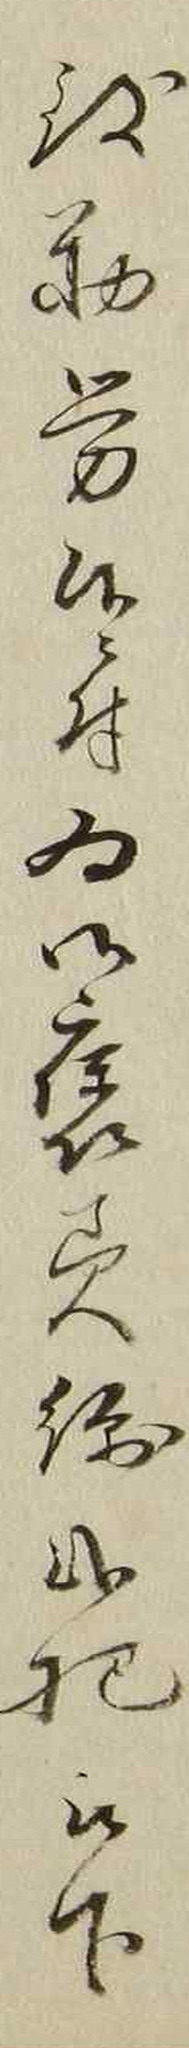致勤労候ニ付為御褒美綿弐把被下
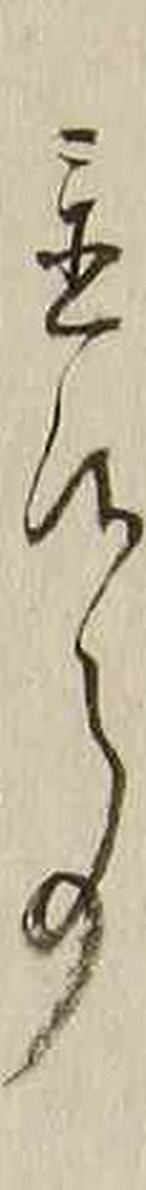置候事
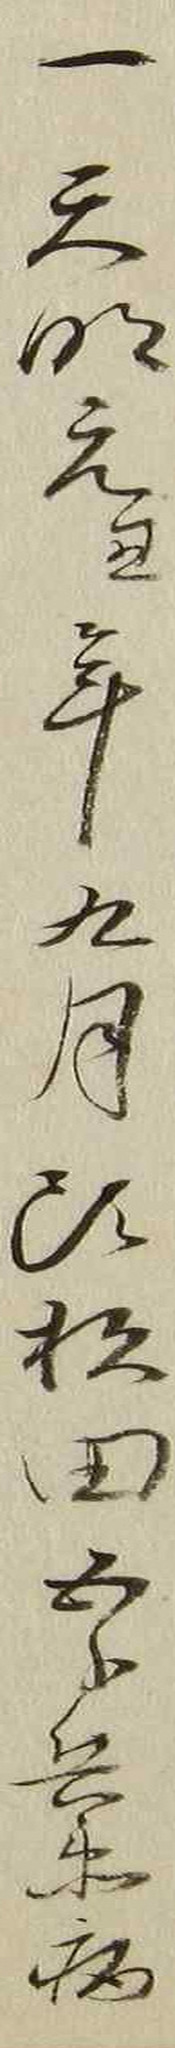一天明元丑年九月頭杉田五郎兵衛病
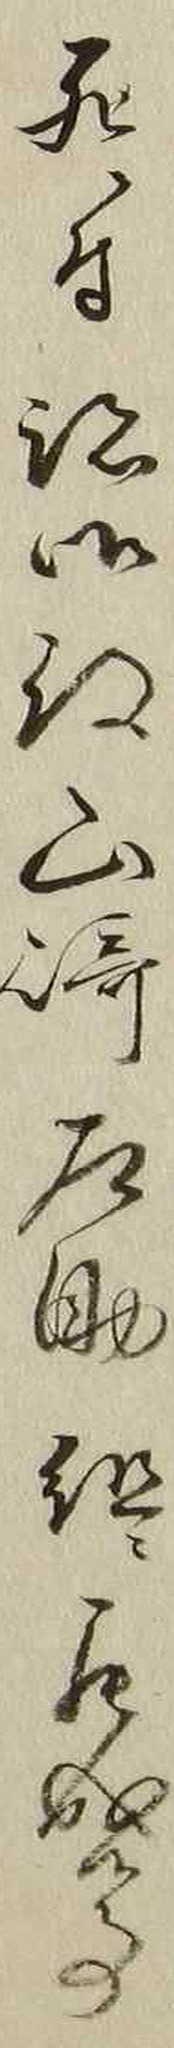死ニ付跡御役山崎左助組ニ罷成候事
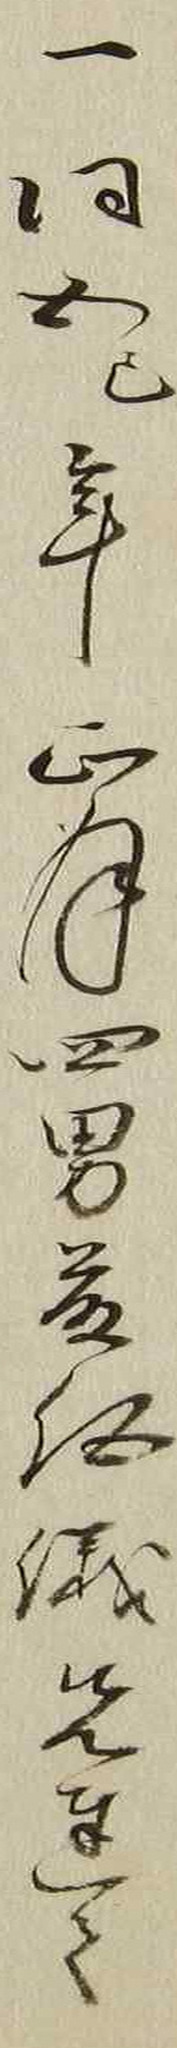一同五巳年正月四男藤伍儀先達て
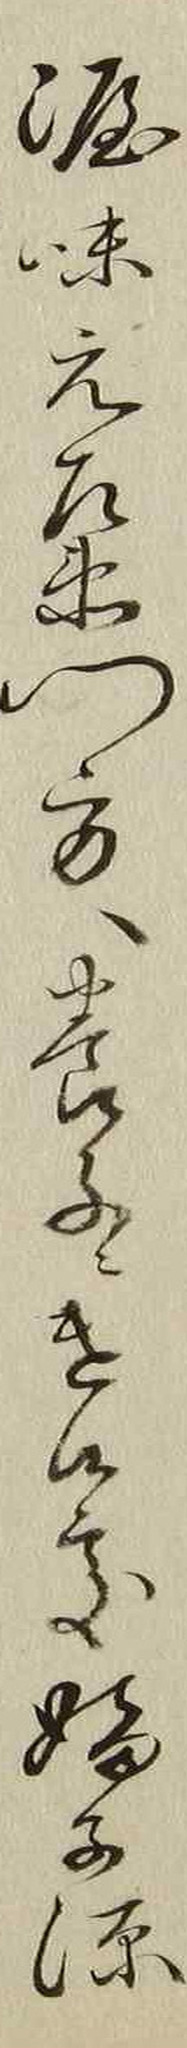渥味元左衛門方へ養子ニ遣候処嫡子源
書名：諸士系譜　巻之52　に之部3
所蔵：会津若松市立会津図書館
